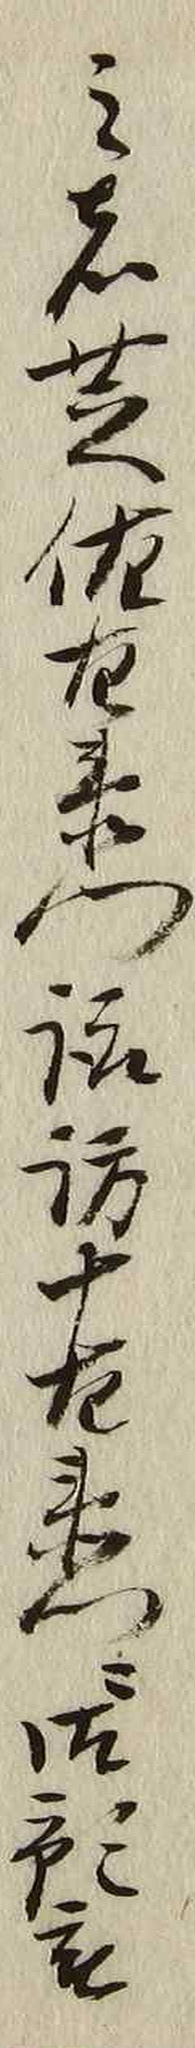之者芝佐左衛門諏訪十左衛門ニ御預被
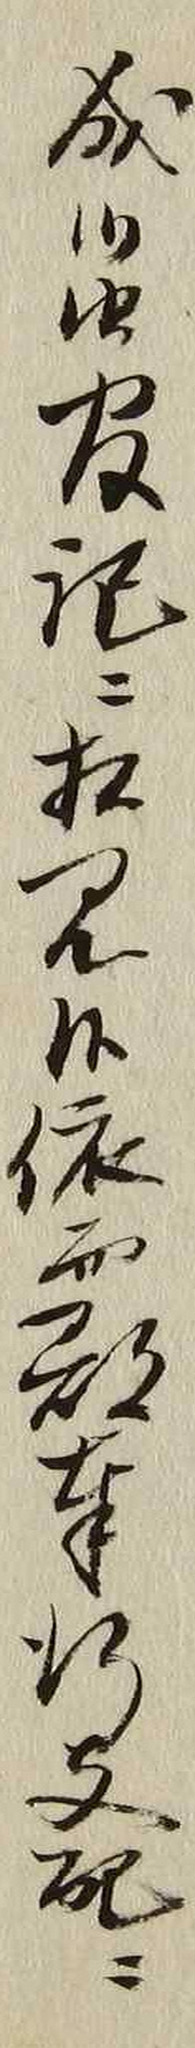成候由官記ニ相見候依而郡奉行文配ニ
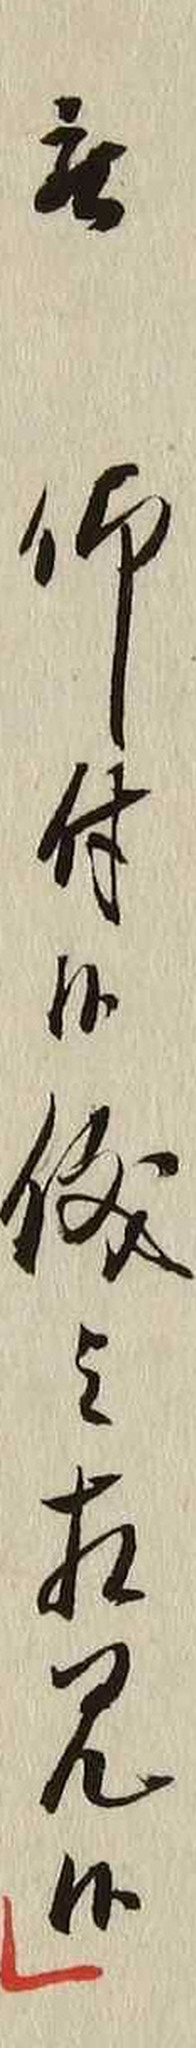被仰付候儀与相見候
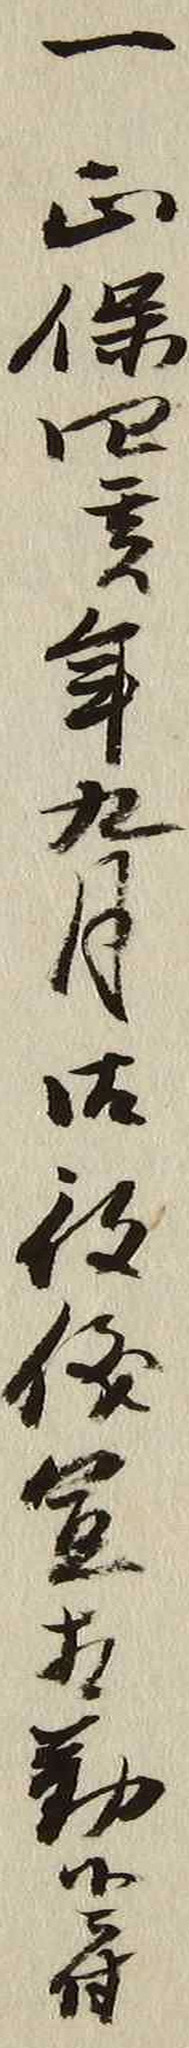一正保四亥年九月御役儀宜相勤候ニ付
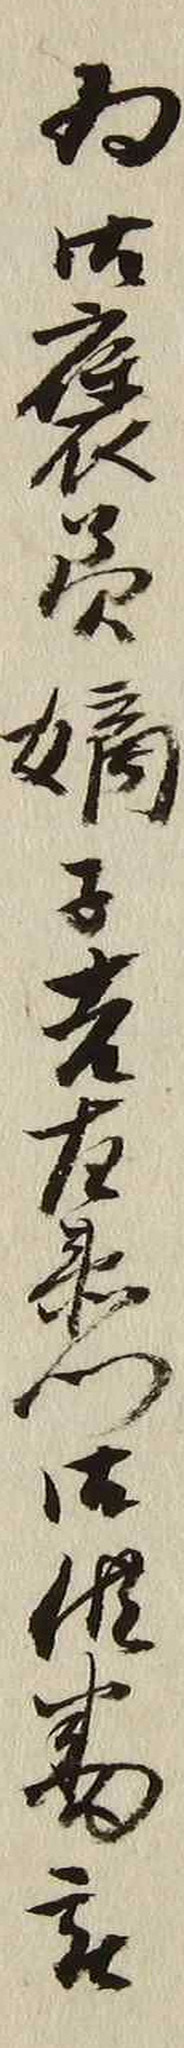為御褒美嫡子吉左衛門御供番被
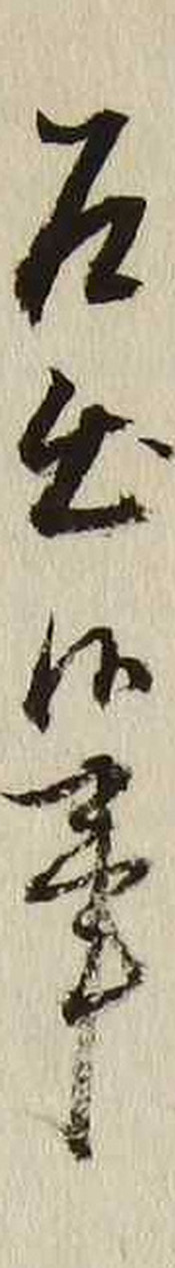召出候事
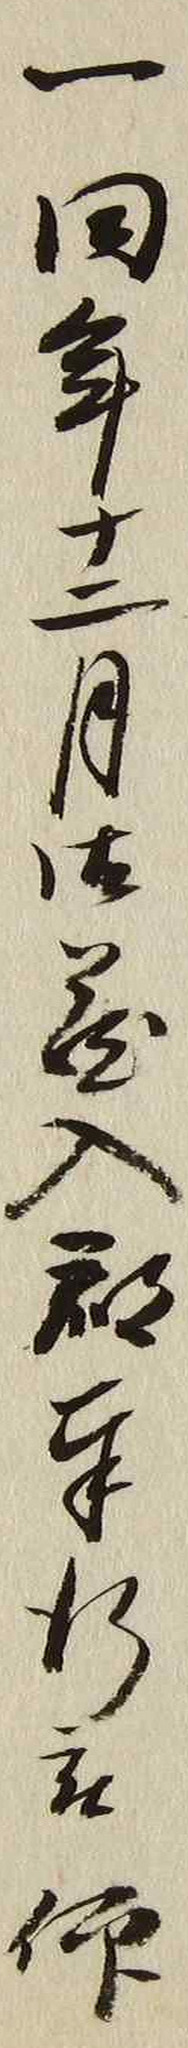一同年十二月御蔵入郡奉行被仰
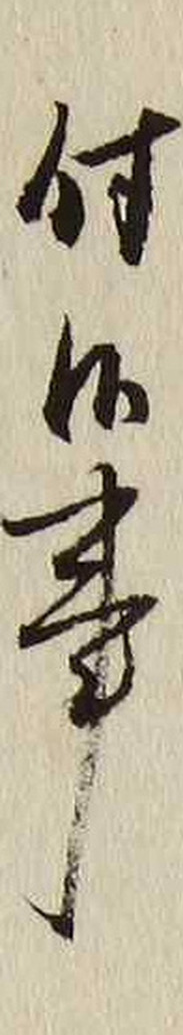付候事
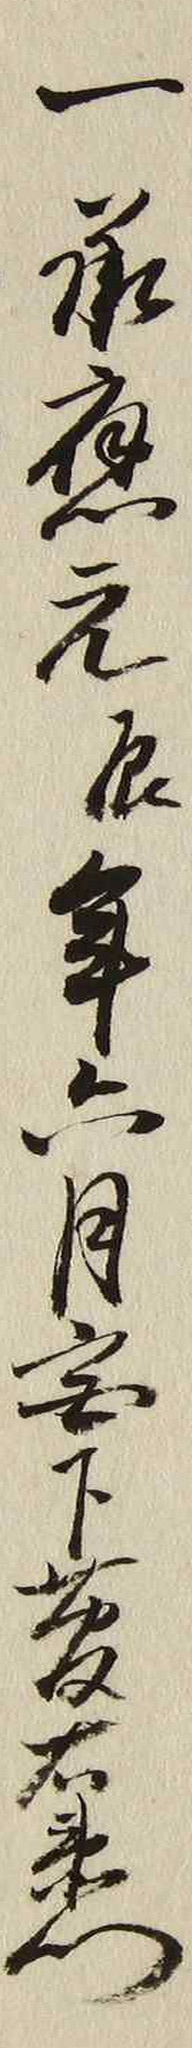一承応元辰年六月宮下菅右衛門
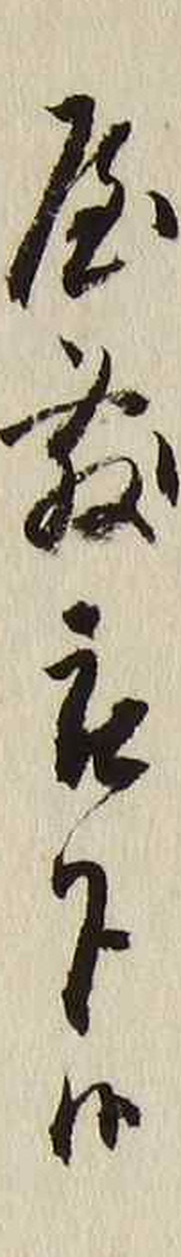屋敷被下候
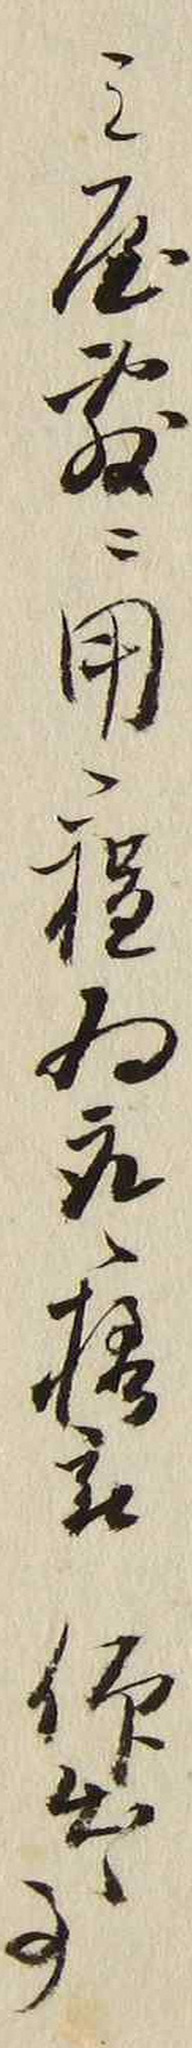之屋敷ニ用候程為取候様被仰出候事

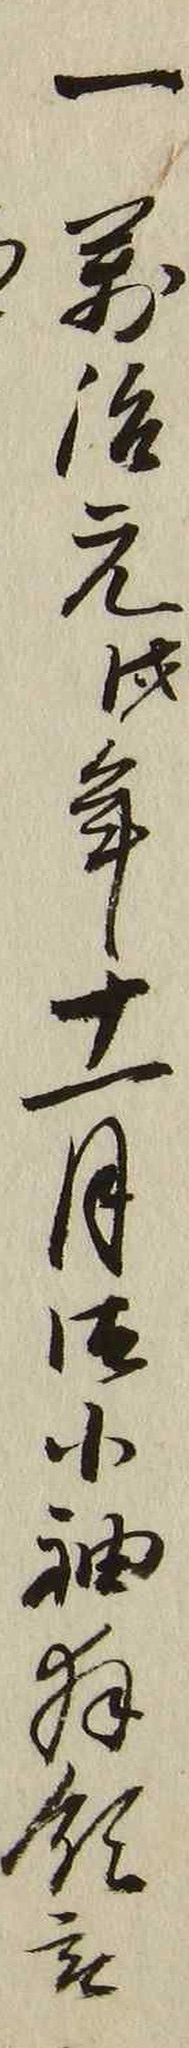一万治元戌年十一月御小袖拝領被
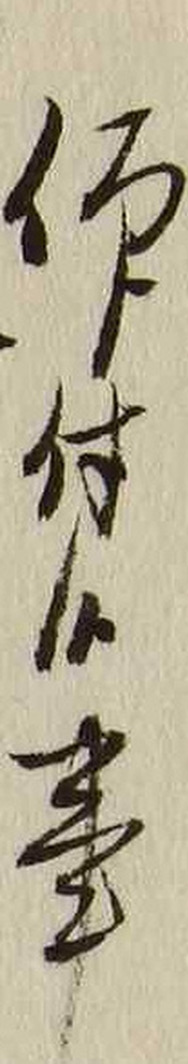仰付候事
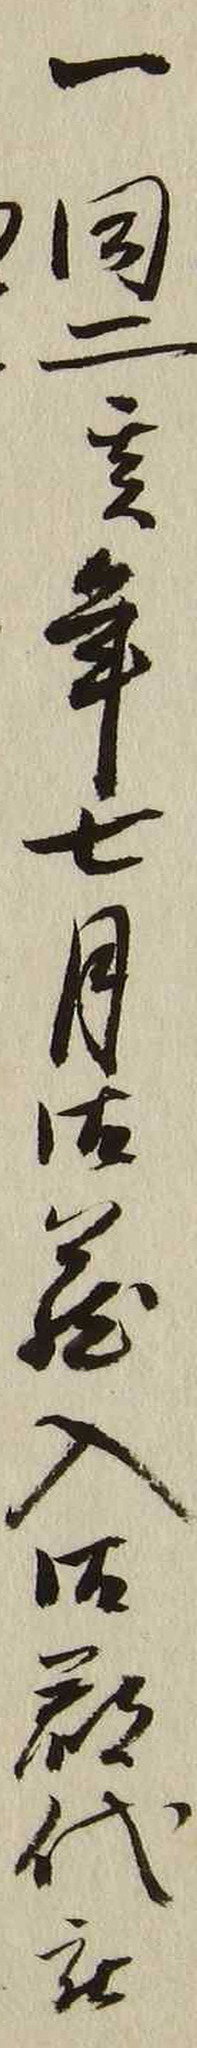一同二亥年七月御蔵入御郡代被
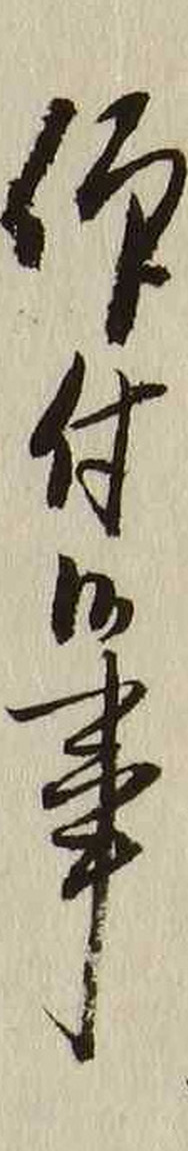仰付候事
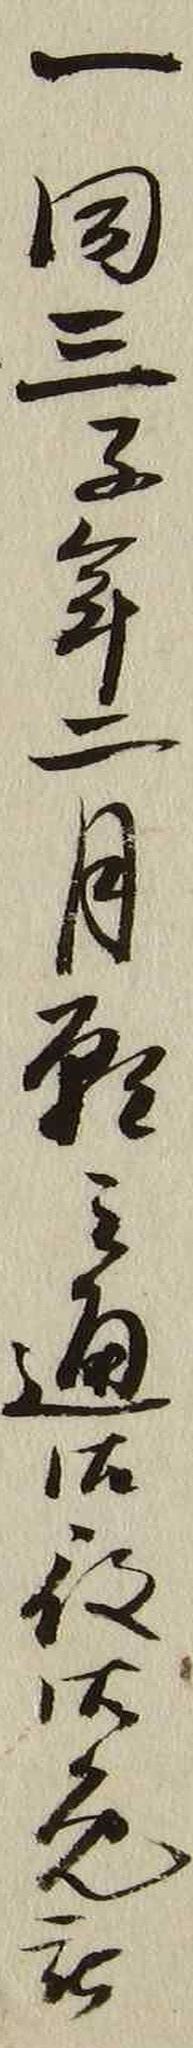一同三子年二月願之通御役御免被
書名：諸士系譜　巻之356　す之部6
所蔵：会津若松市立会津図書館
